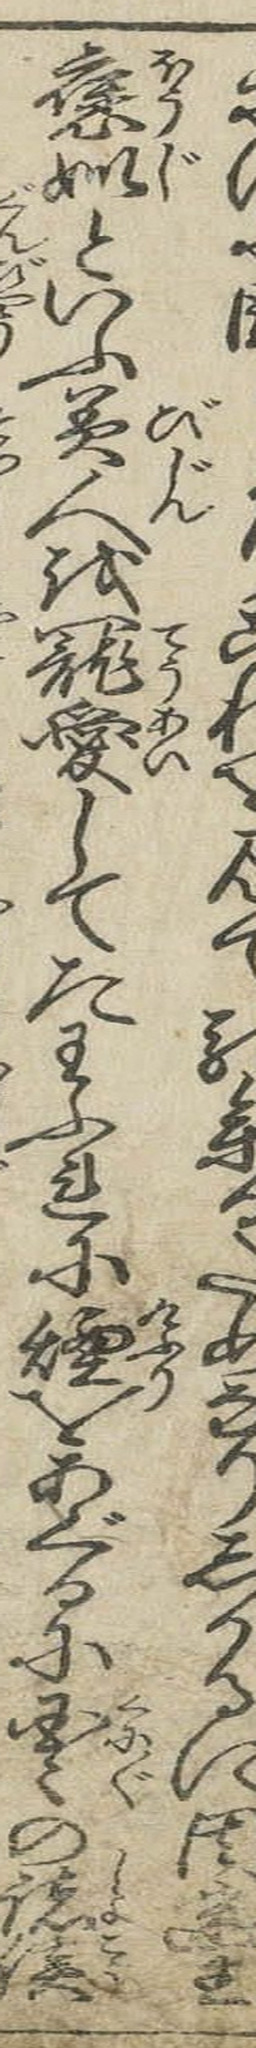褒姒といふ美人を寵愛してたわふれに煙をあぐるに国々の諸侯
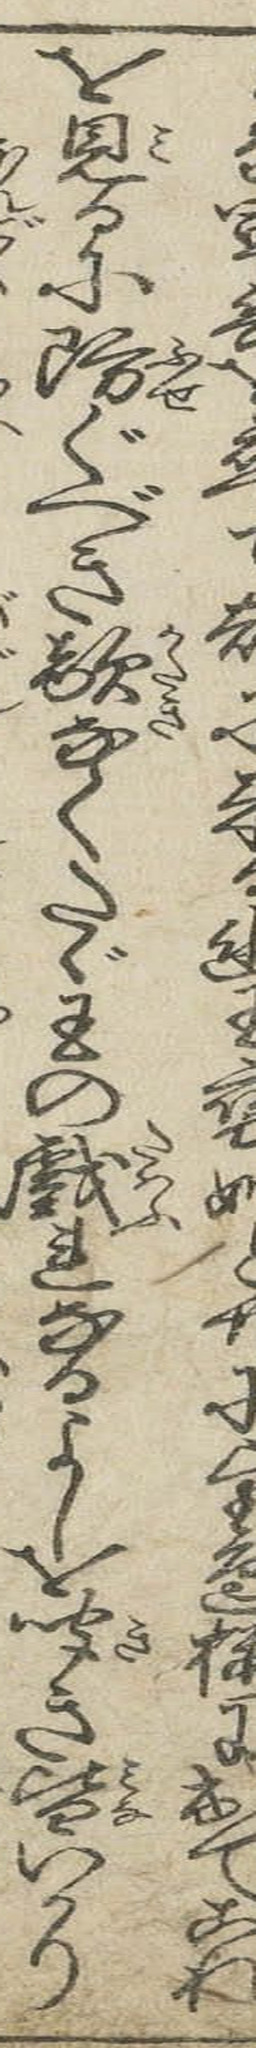を見るに防ぐべき敵なくたゞ王の戯れなるよしを聞き皆いかり
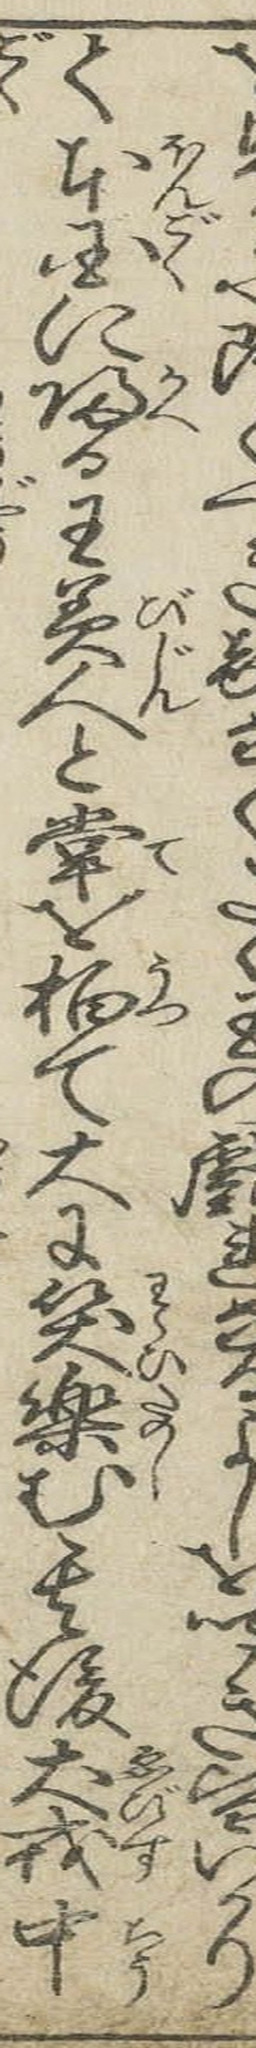て本国に帰る王美人と掌を拍て大に笑楽む其後犬戎中
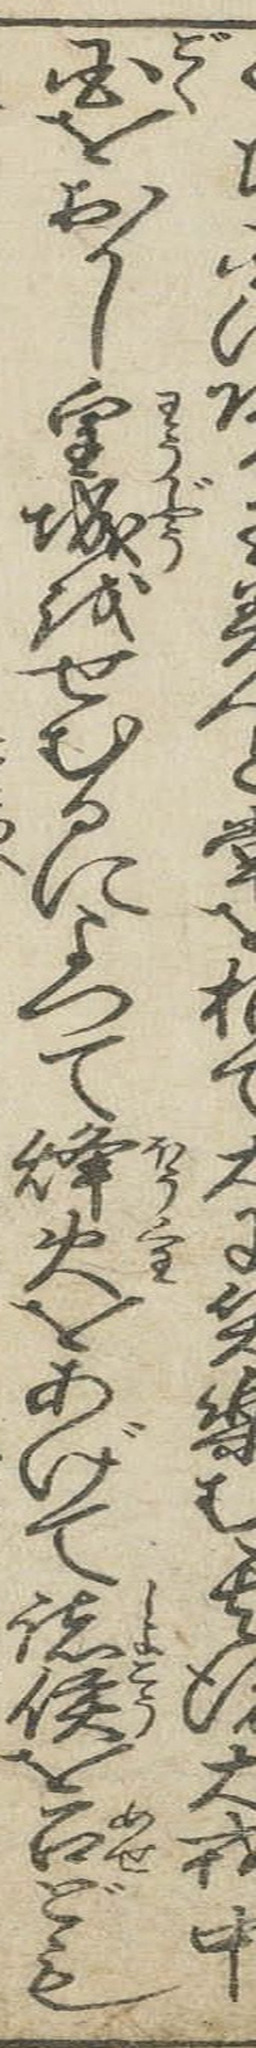国をおかし皇城をせむるによつて烽火をあげて諸侯を召ども
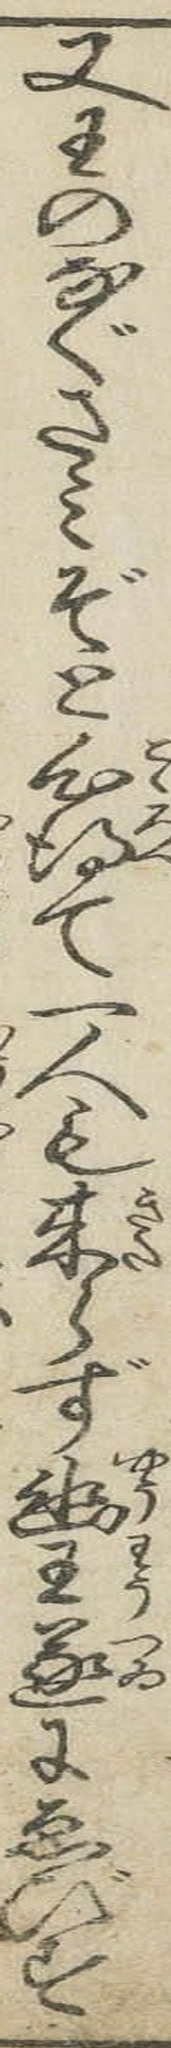又王のなぐさみぞと心得て一人も来らず幽王遂にゑびす
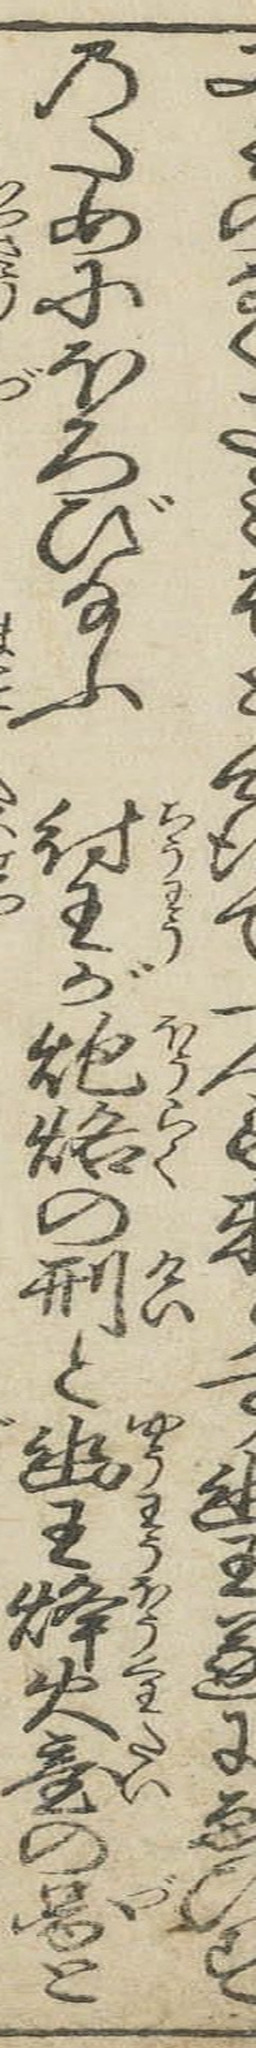のためにほろび給ふ紂王が炮烙の刑と幽王烽火台の図と
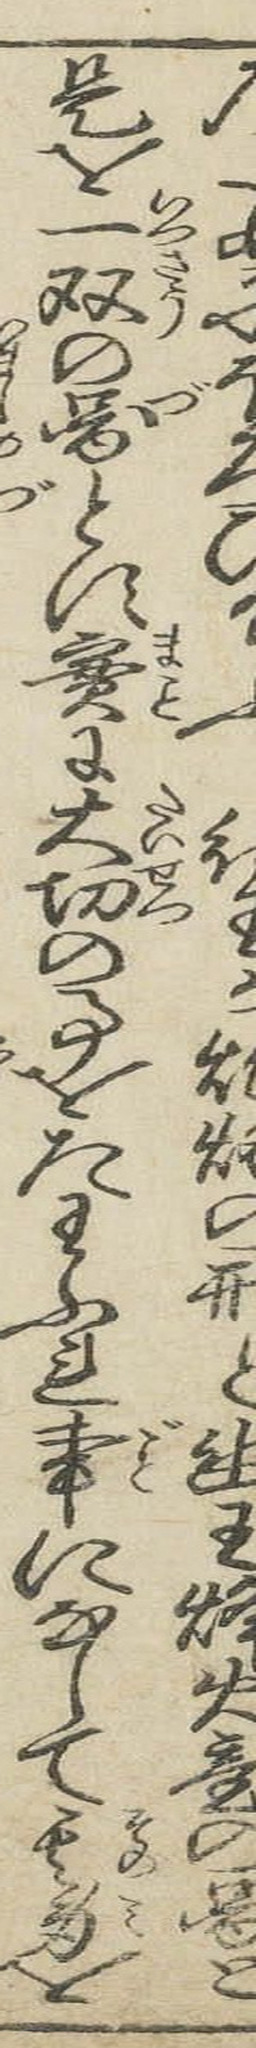是を一双の図とす実に大切の事をたわふれ事になして其身を
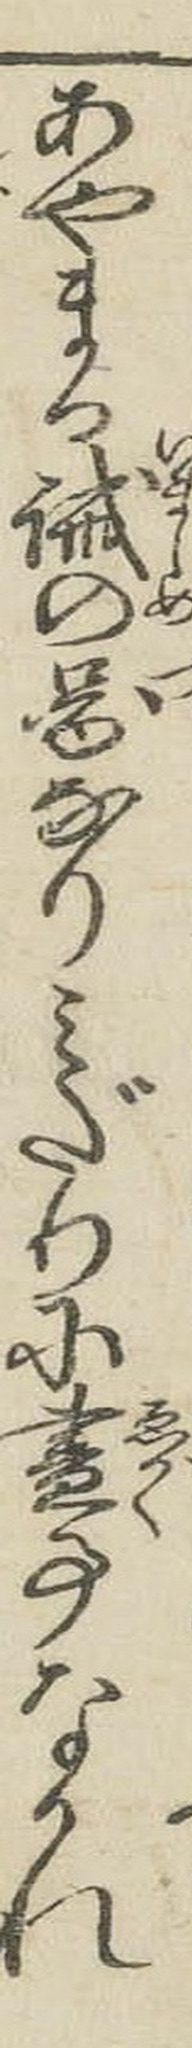あやまる誡の図なりみだりに画事なかれ
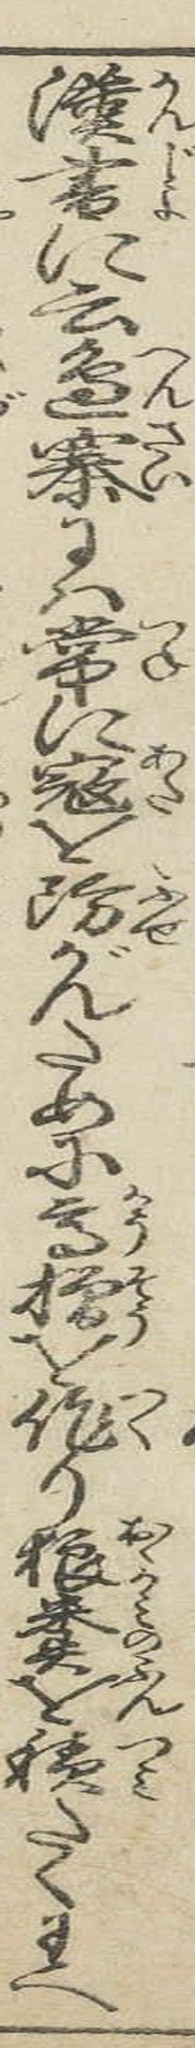漢書に云辺寨には常に寇を防がんために高橧を作り狼糞を積たくわへ
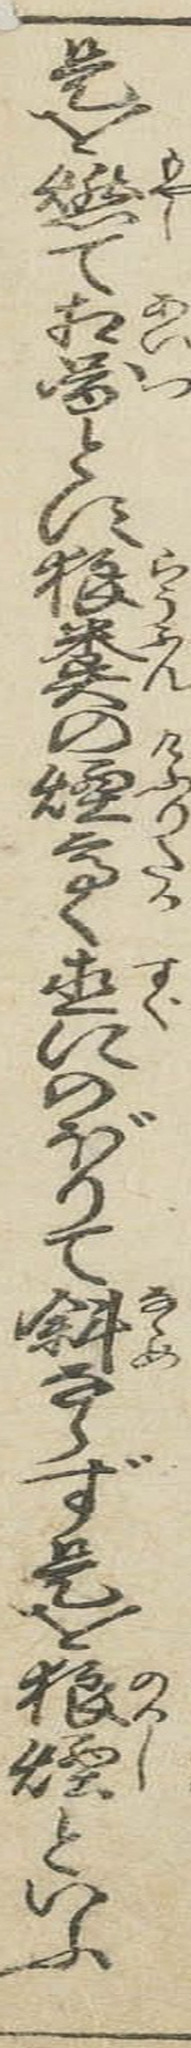是を燃て相図とす狼糞の煙高く直にのぼりて斜ならず是を狼煙といふ
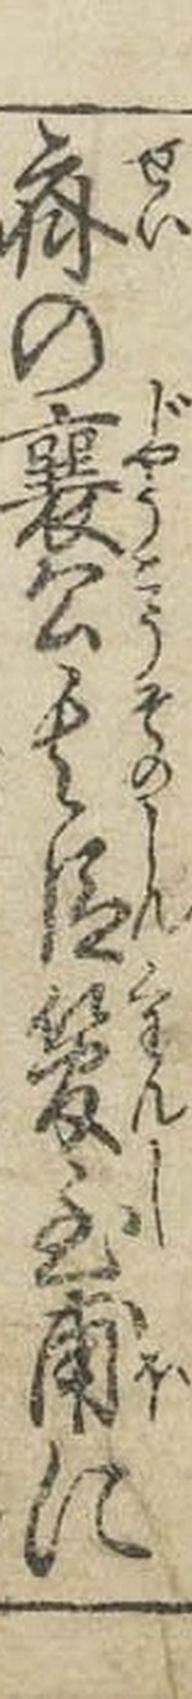斉の襄公其臣管至甫に
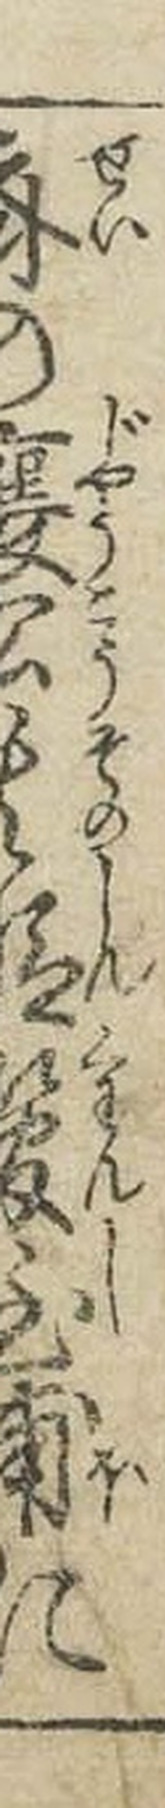斉の襄公其臣管至甫に
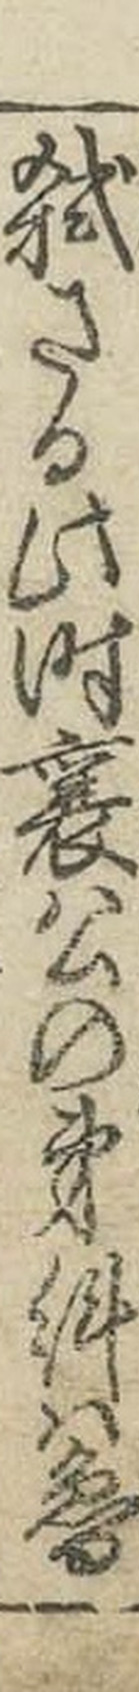弑さる此時襄公の弟糾は魯
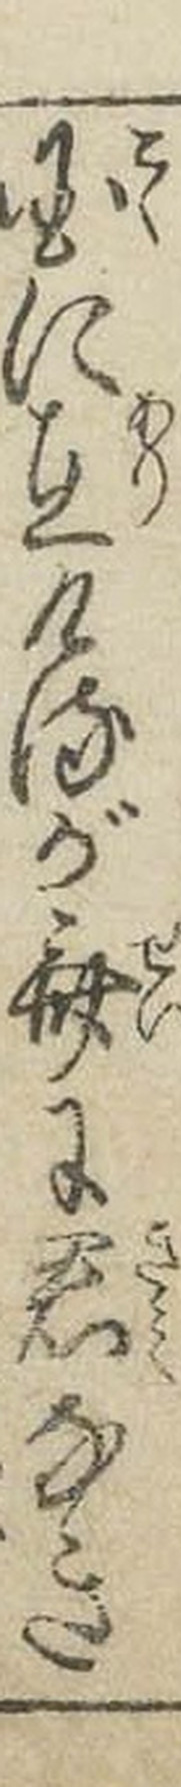国に在けるが斉に君なき
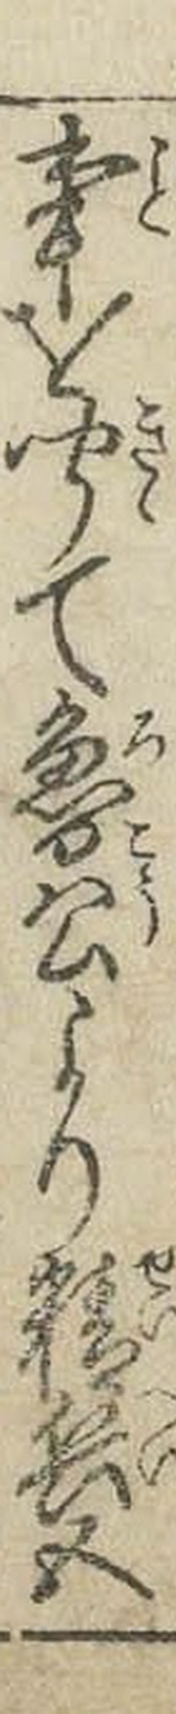事を聞て魯公より精兵五
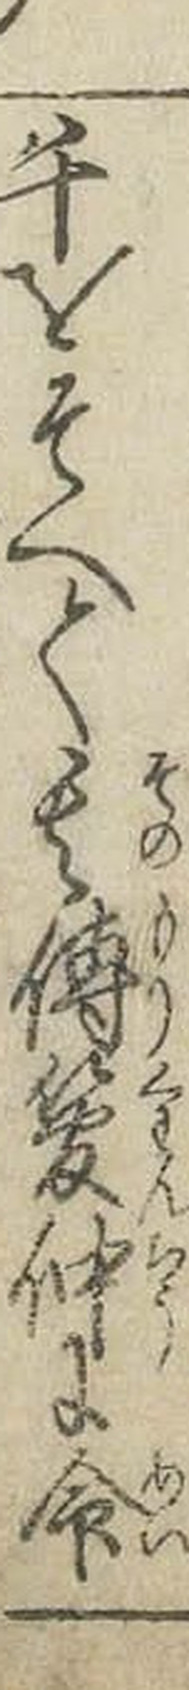千をそへて其傅管仲に命
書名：絵本写宝袋 9巻 5之巻
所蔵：東京学芸大学教育コンテンツアーカイブ
